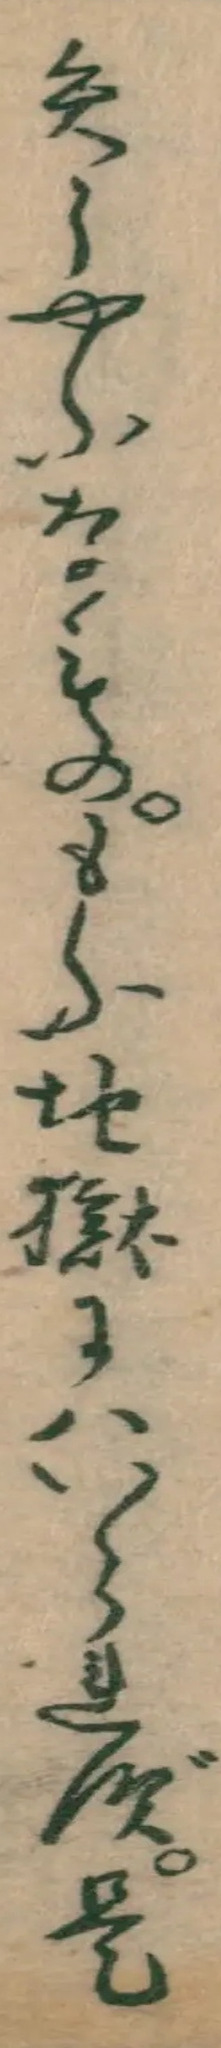失うやふなもの。もふ地獄にはいられず。是
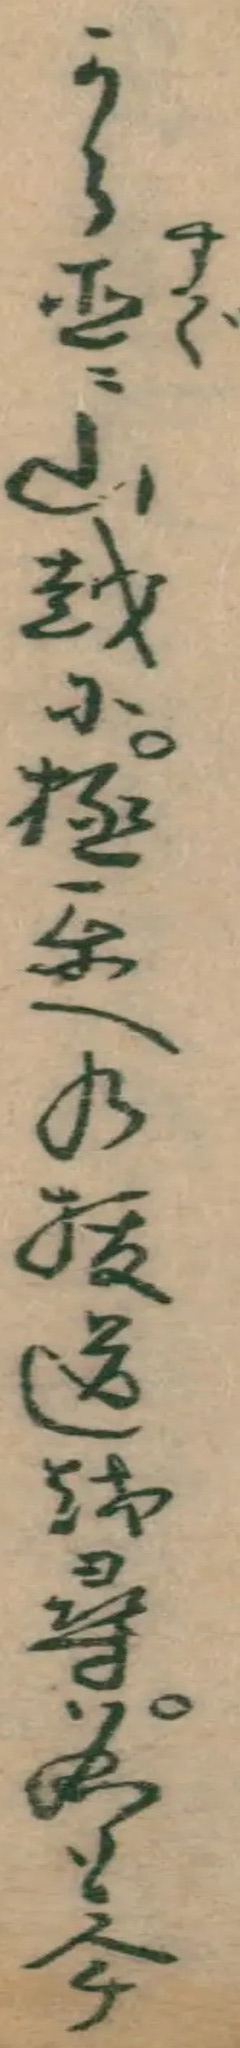から直に山越に。極楽への抜道を尋。若も今
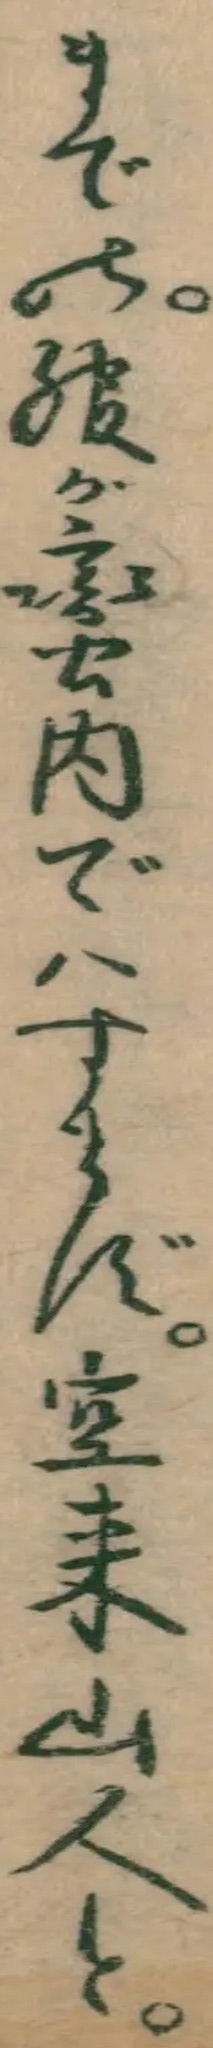までの。腹が蛮内ではすまず。空来山人と。
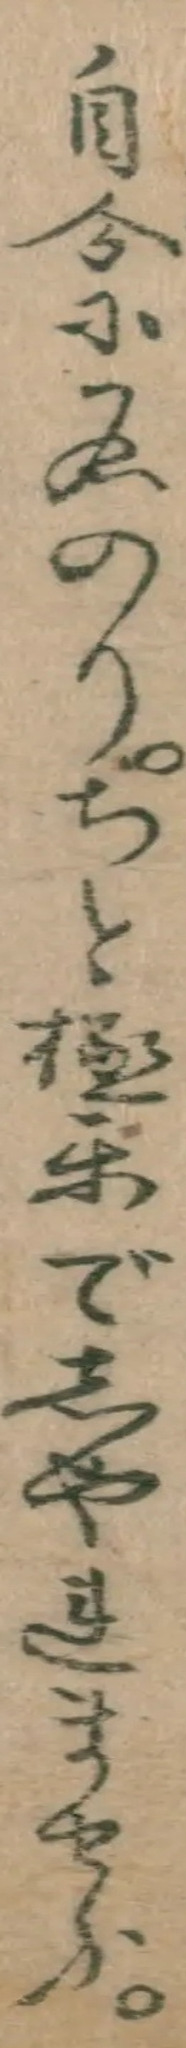自分に名のり。ちと極楽でしやれませふ。
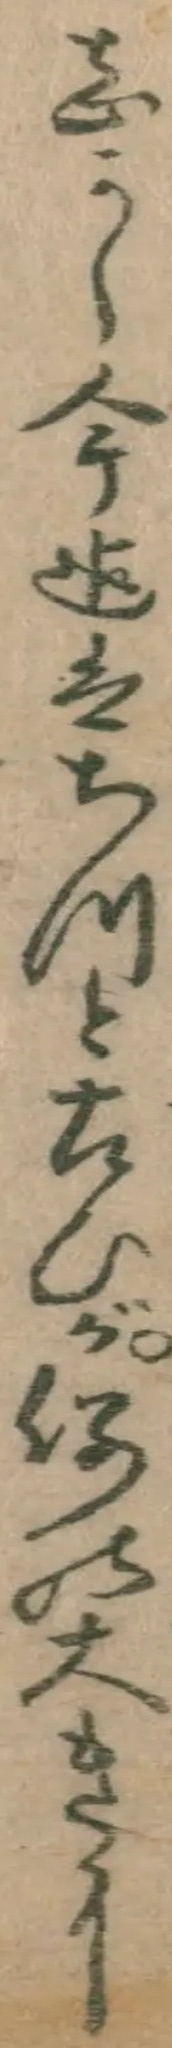しかし今迄はちつと古ひが。例の大きに
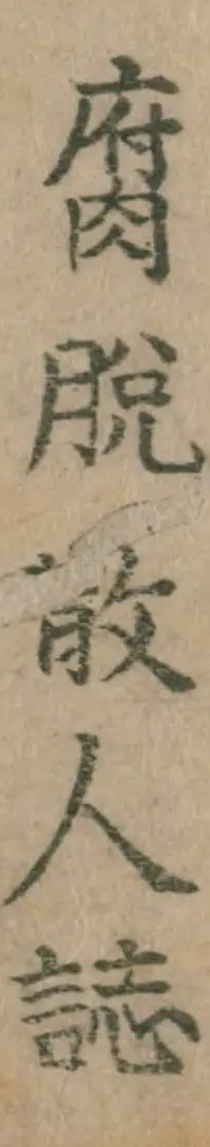腐脱散人誌
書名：翻草盲目
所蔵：国立国会図書館 National Diet Library, JAPAN
